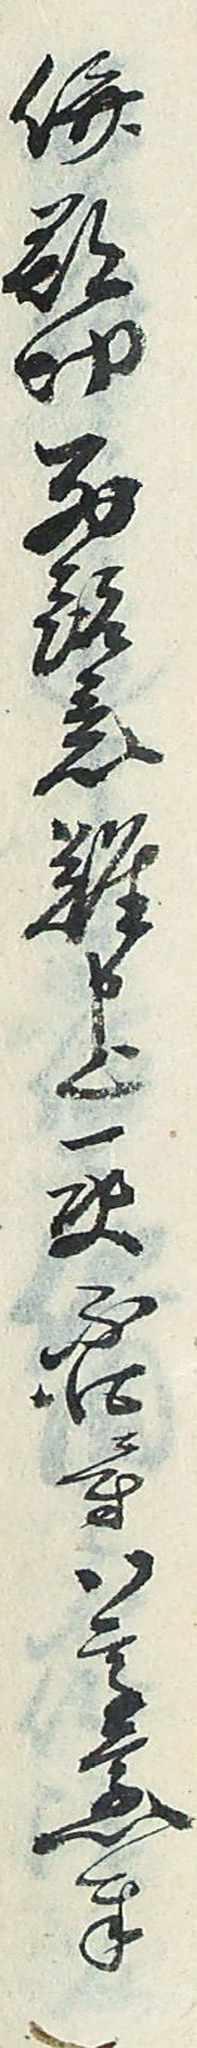併郡切別趣意難申上一決不仕ニ付御高慮奉
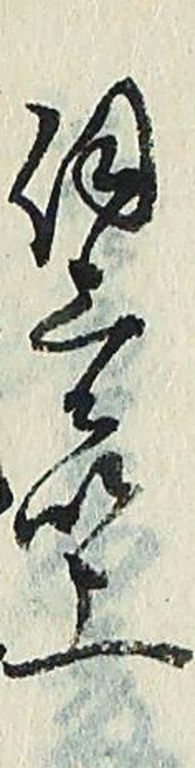伺上候以上
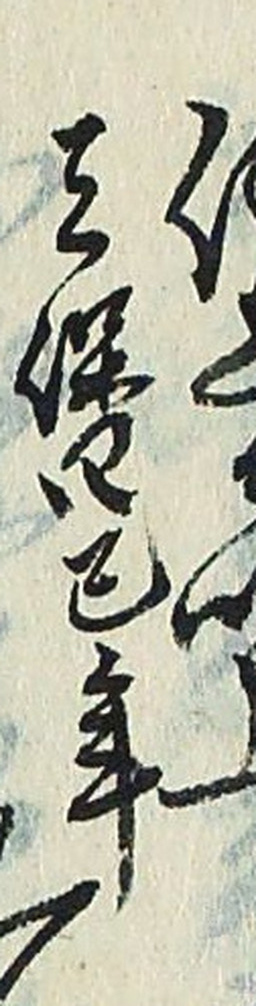天保四巳年
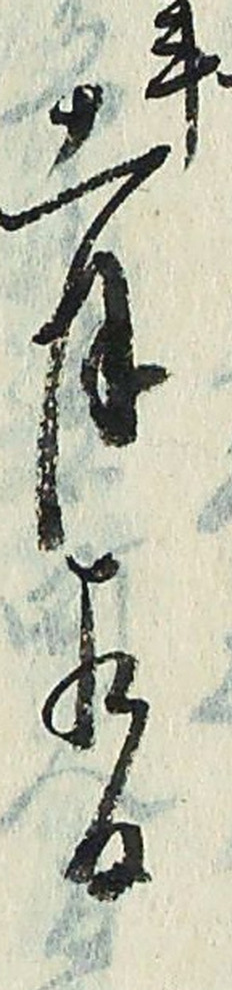十一月十九日
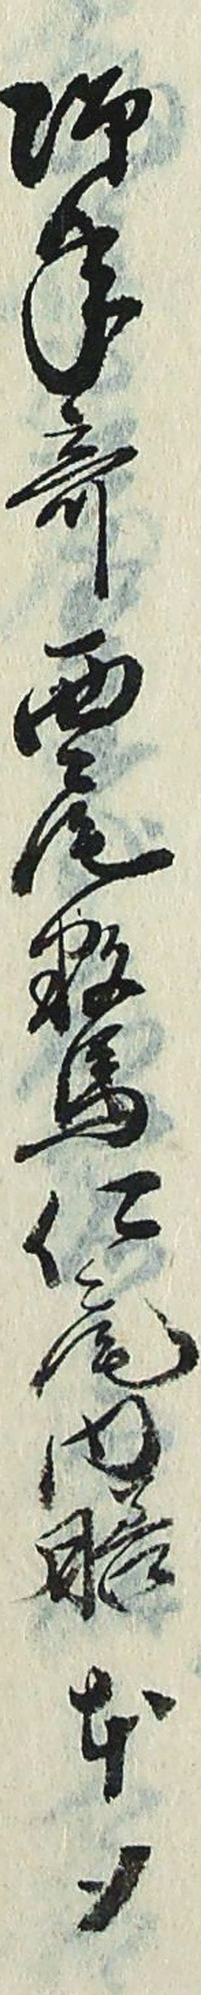御年寄西尾数馬仁尾内膳本〆
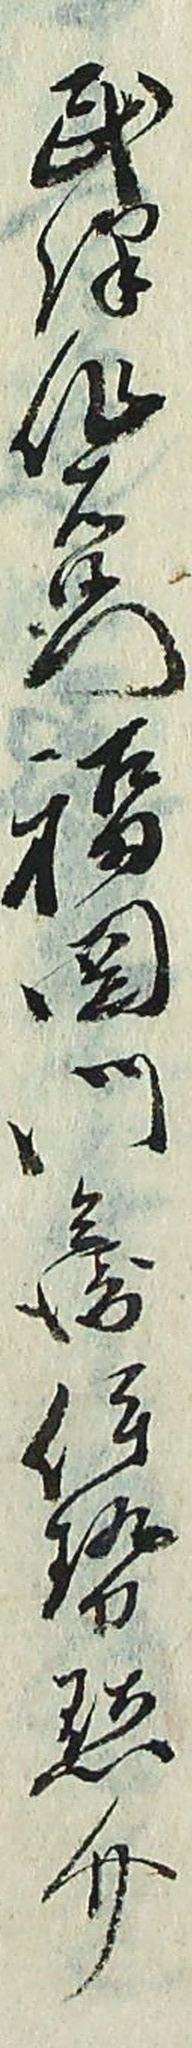武澤作右衛門福岡門兵衛伊勢黙介
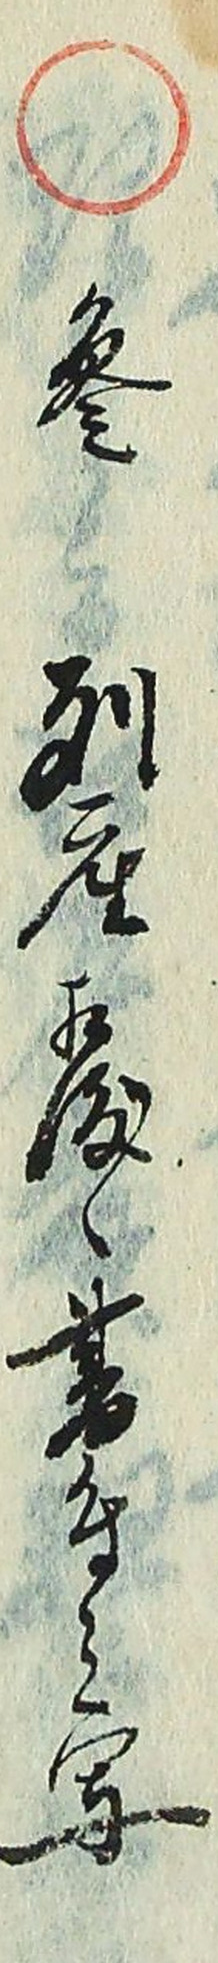列座相渡候書付之写
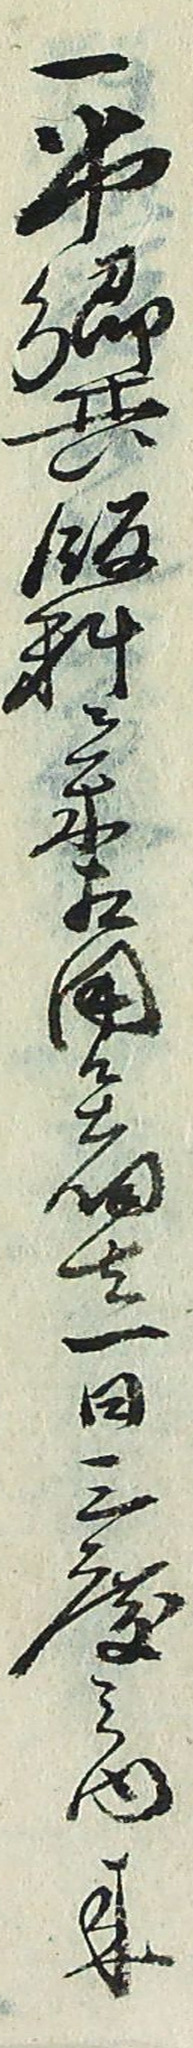一市郷共飯料ニ米相用候者は一日三度之内来
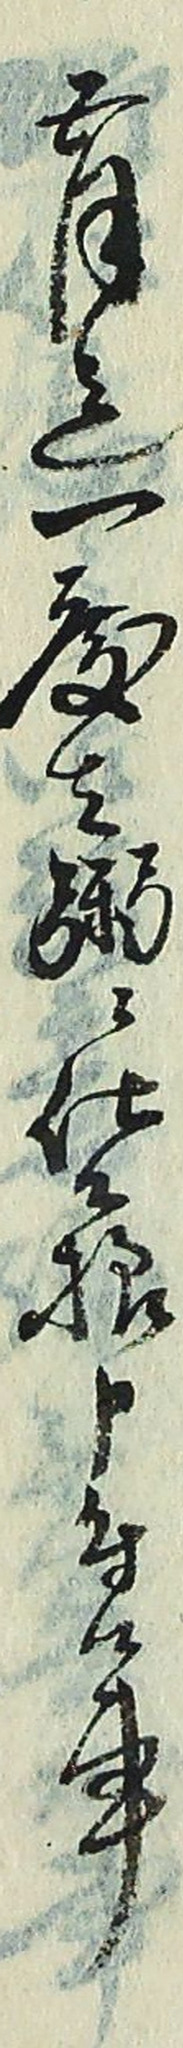五月迄一度者粥ニ仕候様申付候事
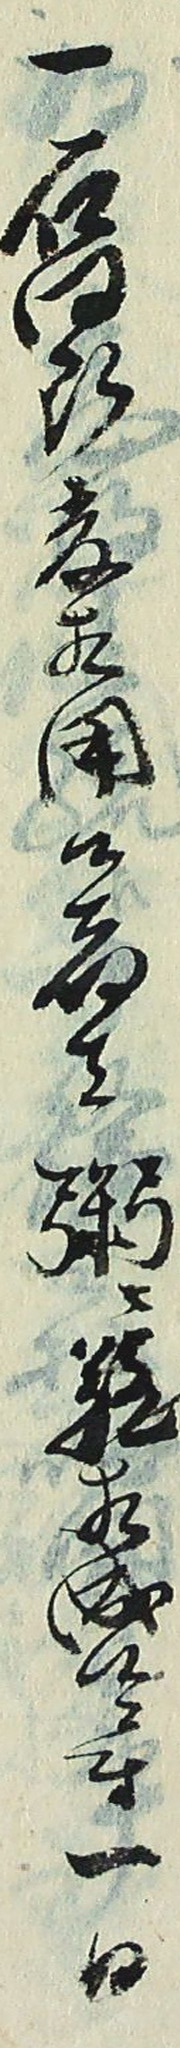一右同断麦相用候者は粥ニ難相成候ニ付一日
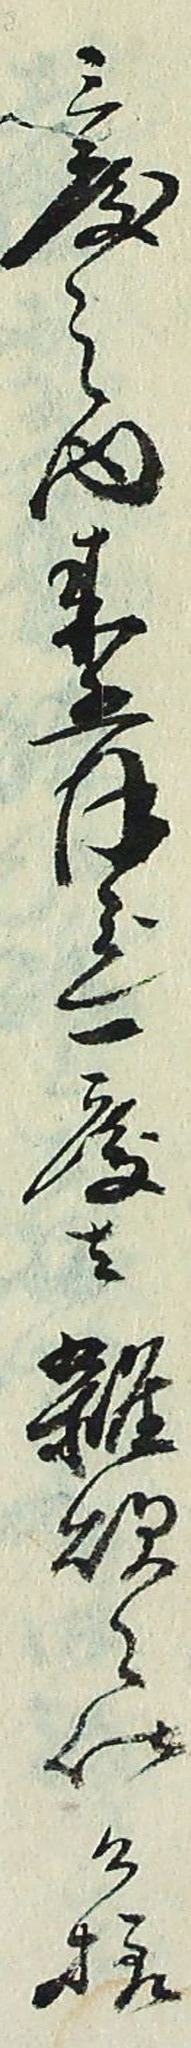三度之内来五月迄一度者雑炊ニ仕候様
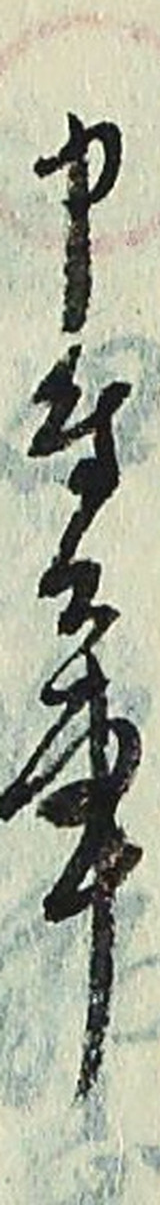申付候事
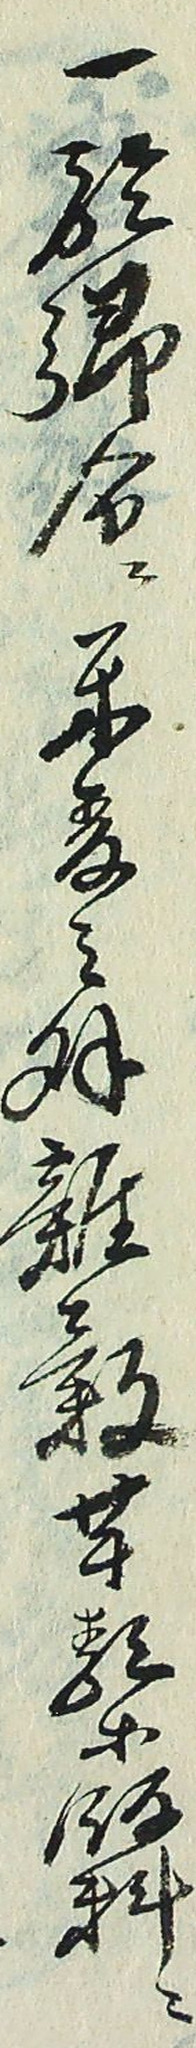一於郷分ニ米麦之外雑穀芋類等飯料ニ
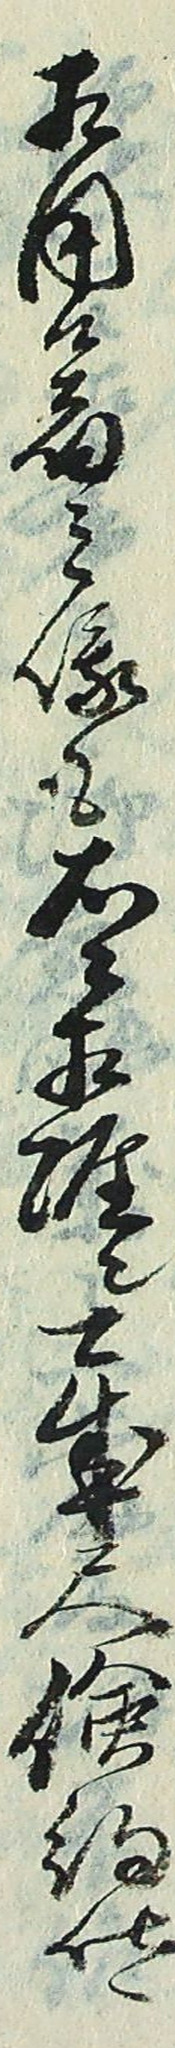相用候者之儀も右ニ相准シ可成丈倹約仕候
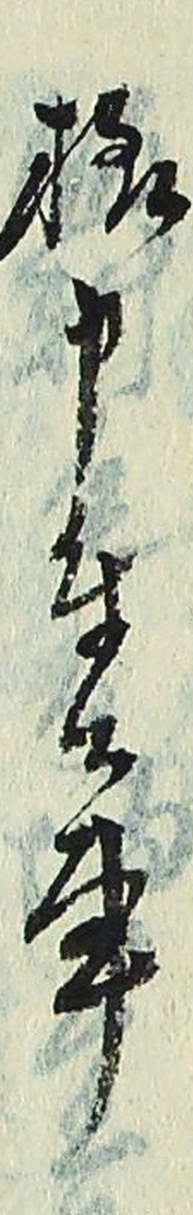様申付候事
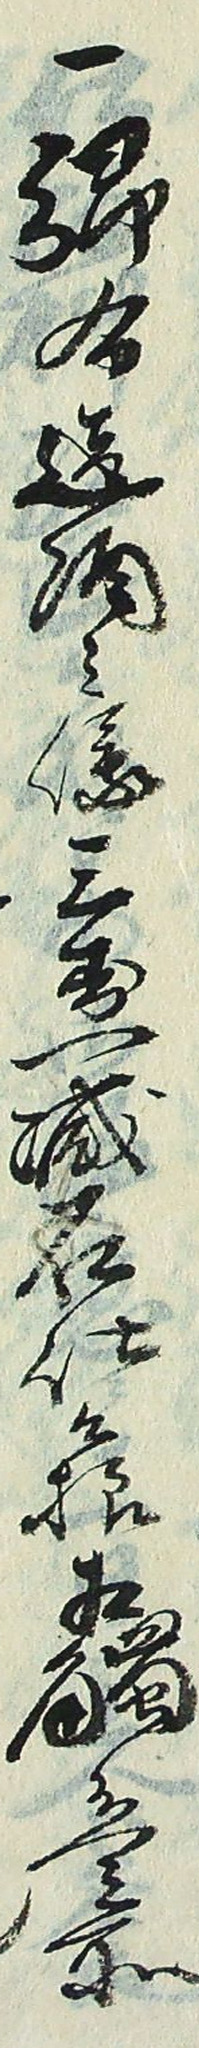一郷分造酒之儀三歩一減石仕候様相觸有之所
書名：諸御趣意書并御下知向之写
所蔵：鳴門教育大学 Naruto University of Education
